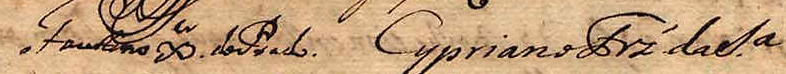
Faustino x.er do Prado. Cypriano Frz̄ da S.a
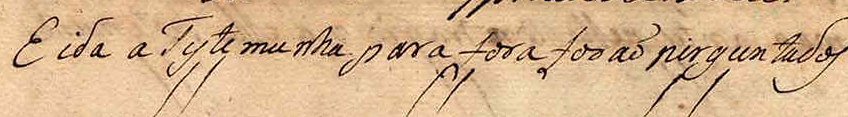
E ida a Testemunha para fora foraõ pirguntados
